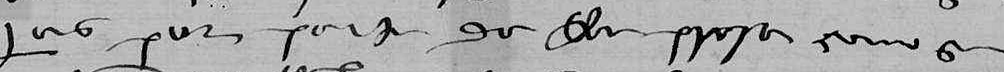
tas por parte da Ree presa como se
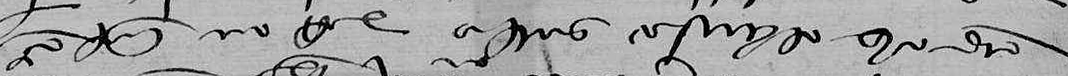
c̄otem no Rol atras coseyto ho dīo
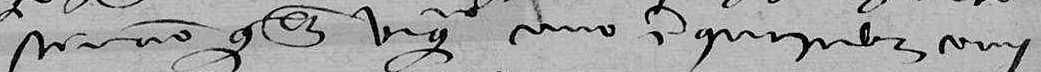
simão gl̄z vigro como ēqueredor comj
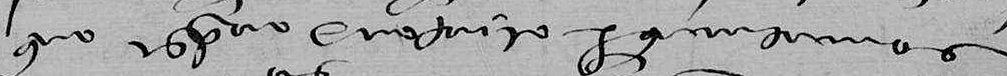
guo esp̄ão e notairo ꝑgumtamos
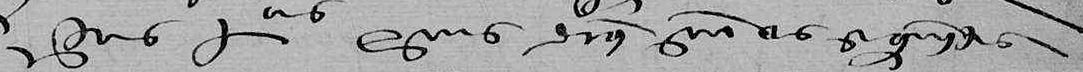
estas tas e seus dīꝯ são os segūjtes
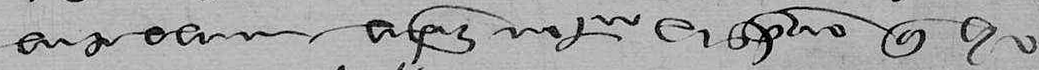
bertollameu lopez notro e esp̄ão q̄ ho
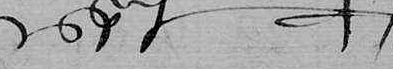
esp̄uj
